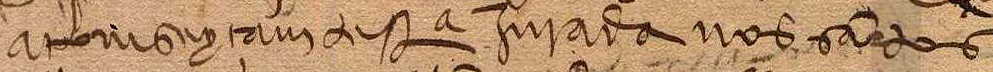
a comseyçam testa Jurada nos sātos
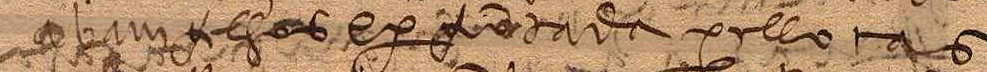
avamgelhos e ꝑgūtada pello caso
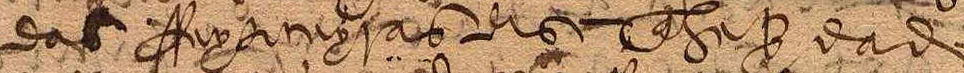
das ffeyticeyras dise q̄ he ꝟdade
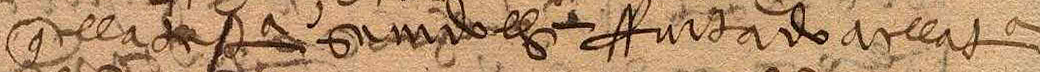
q̄ ella testa semdo lhe ffurtado a ella ta
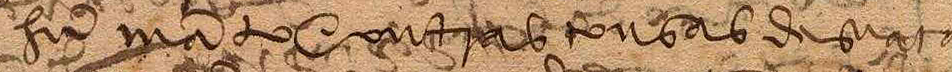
hū māto e outras cousas de sua ca
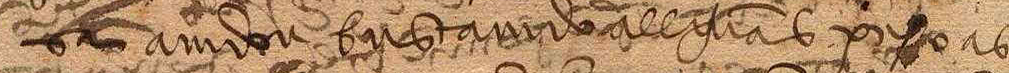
sa amdou buscamdo allgūas pesoas
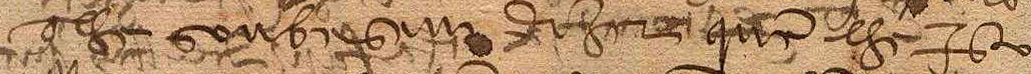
q̄ lhe soubesem dizer quē lhe Jsto
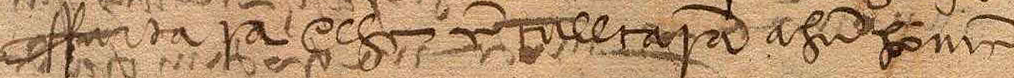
ffurtara e lhe ēcullcarā a hū homē
